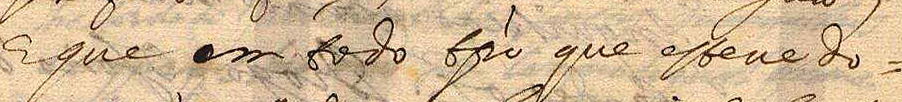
E que em todo tpō que esteue do
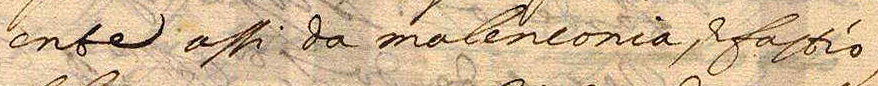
ente assi da malenconia, E fastio,
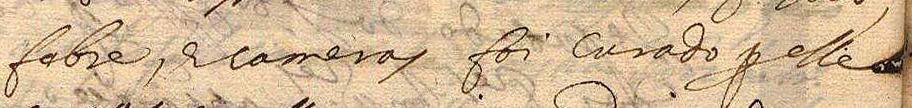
febre, E cameras foi curado ꝑ elle
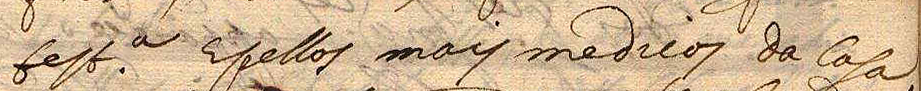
test.a E pellos mais medicos da Casa,
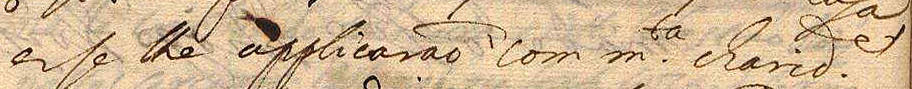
e se lhe applicaraõ com m.ta charid.e
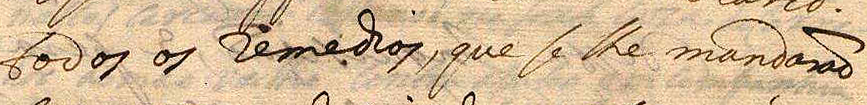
todos os Remedios, que se lhe mandaraõ
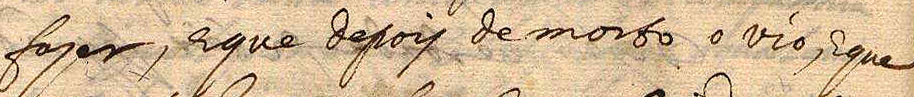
fazer, E que depois de morto o vio, E que
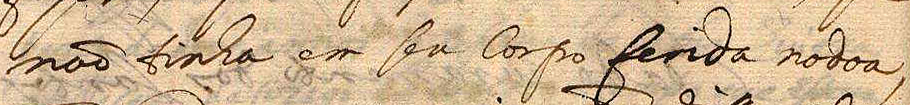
naõ tinha em seu Corpo ferida nodoa,
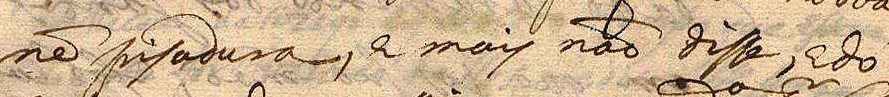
nē pisadura, E mais não disse, E do
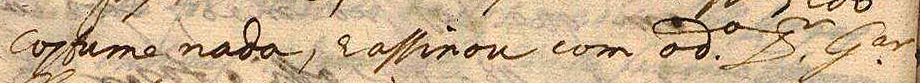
costume nada, E assinou com o d.o sr. G.ar
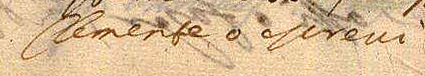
Clemente o escreui
